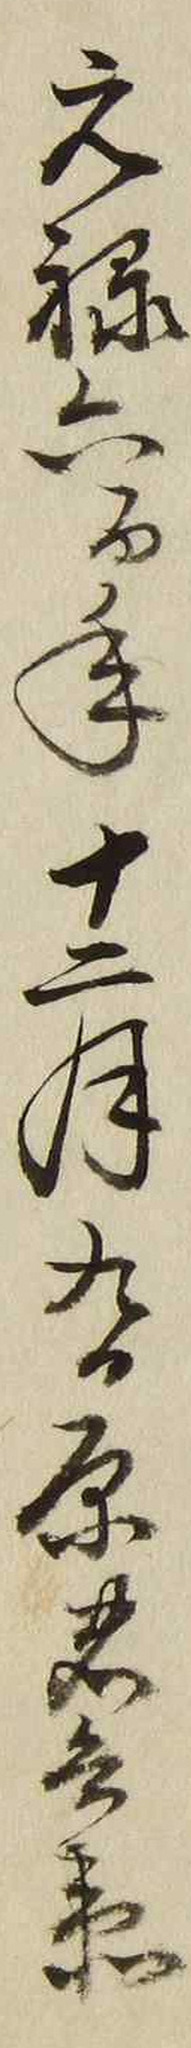元禄六酉年十二月九日原忠兵衛

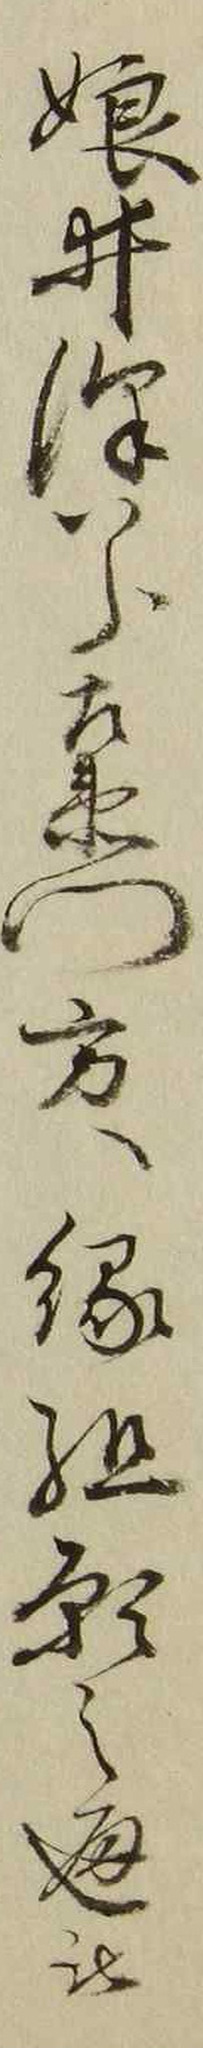娘井沢八郎左衛門方へ縁組願之通被
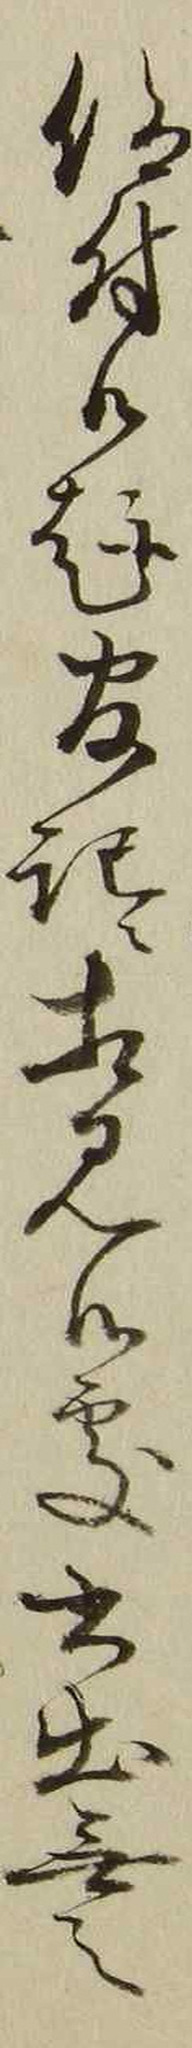仰付候趣官記ニ相見候処書出無之
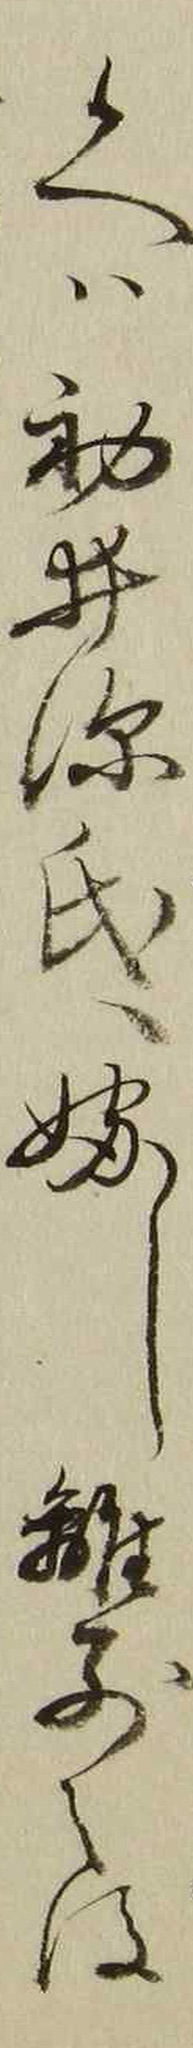候へハ初井深氏へ嫁し離別之後
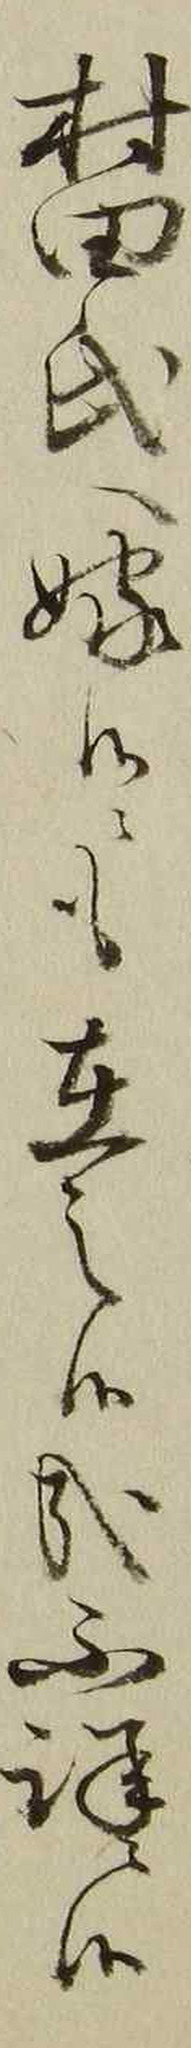村田氏へ嫁候ニも在之候哉不詳ニ候
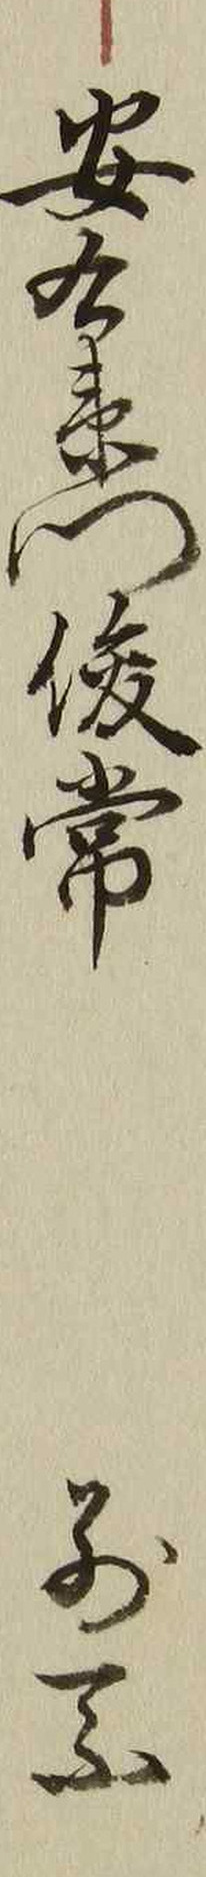安右衛門俊常別系
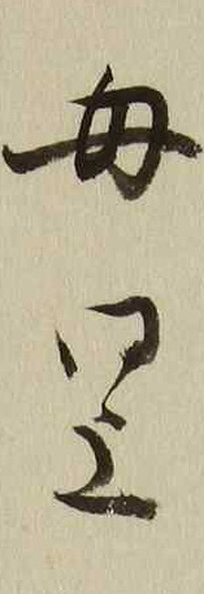母同上
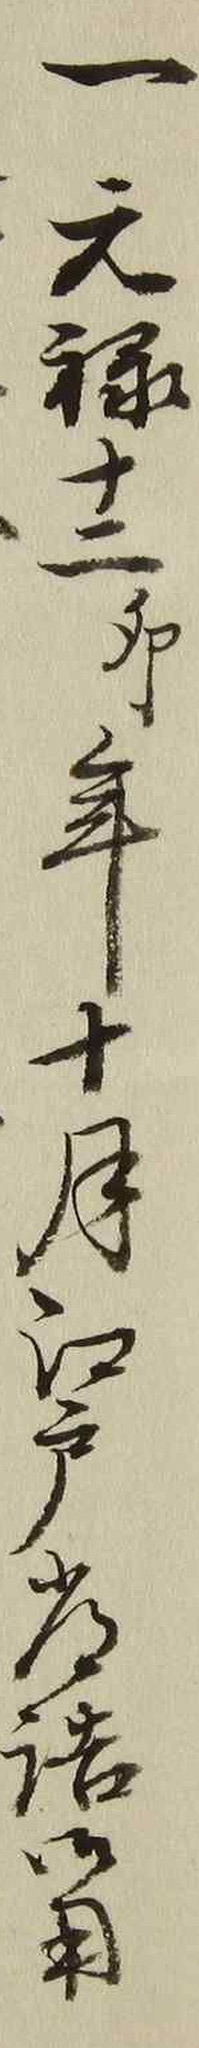一元禄十二卯年十月江戸常詰御用
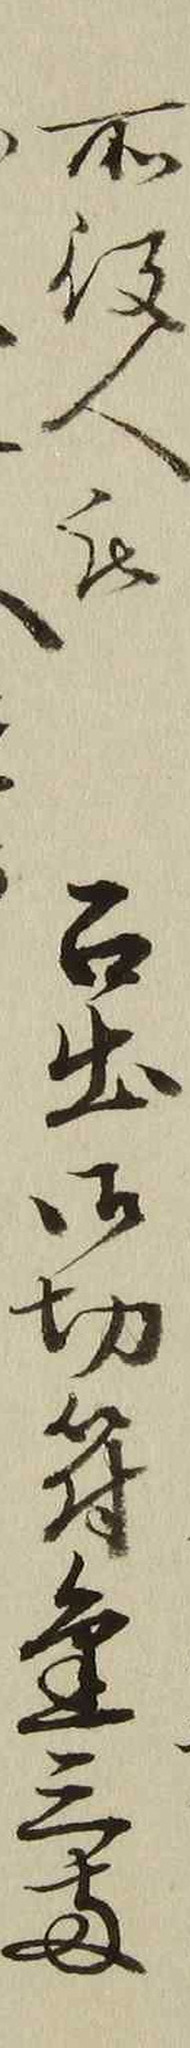所役人被召出御切符金三両
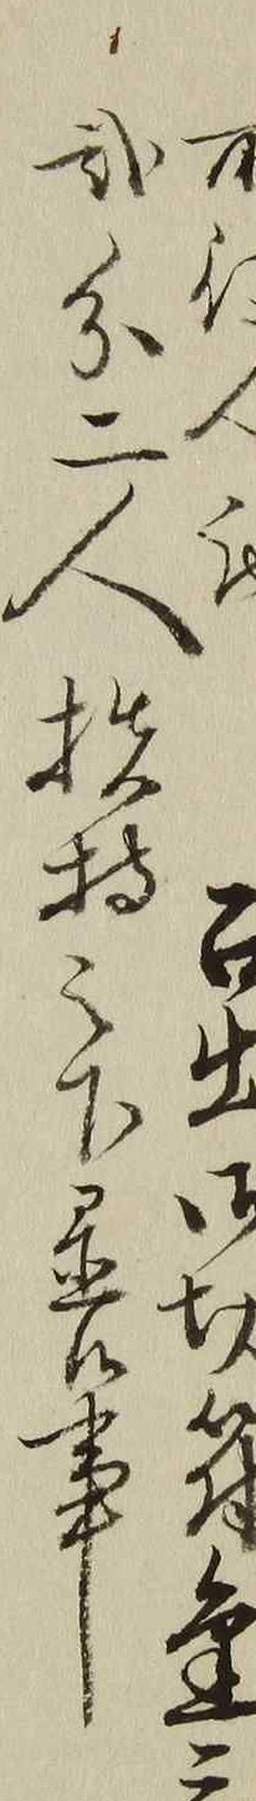弐分二人扶持被下置候事
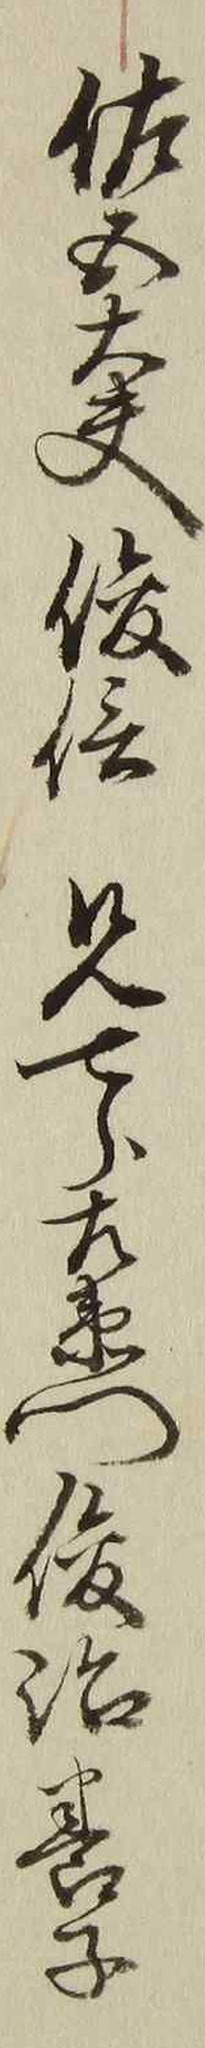佐五大夫俊信兄七郎左衛門俊治養子
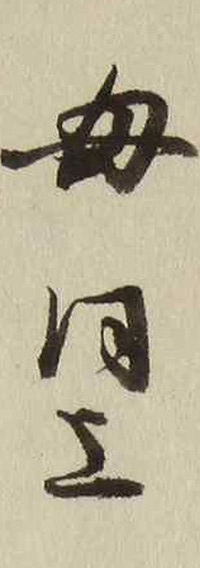母同上
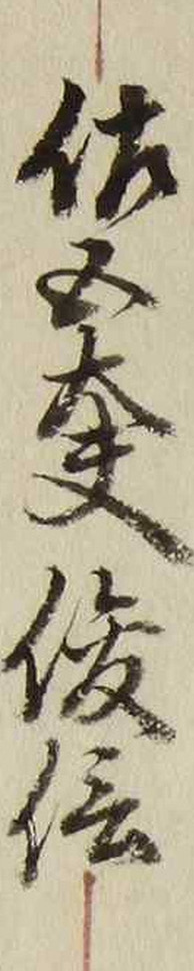佐五大夫俊信

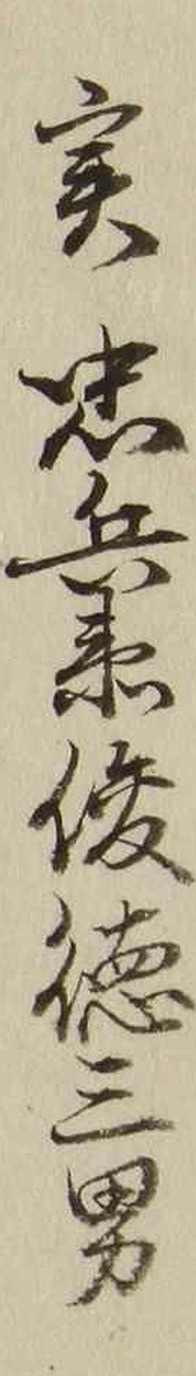実忠兵衛俊徳三男
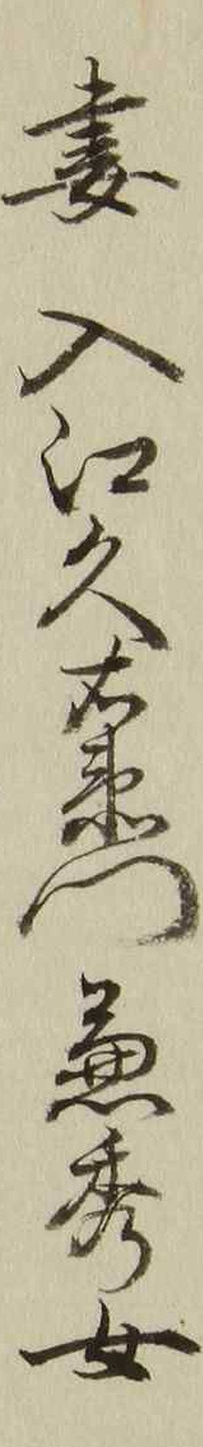妻入江久右衛門兼秀女
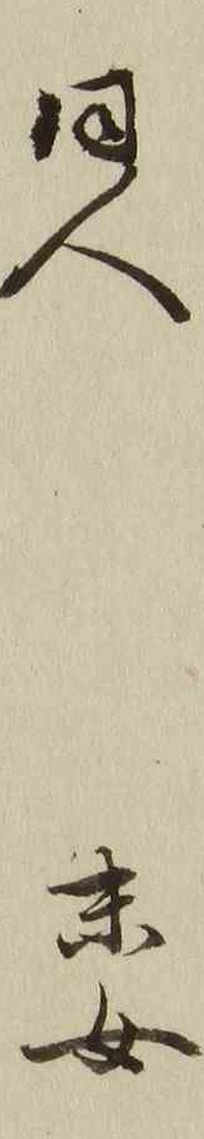同人末女
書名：諸士系譜　巻之36　は之部4
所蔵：会津若松市立会津図書館
